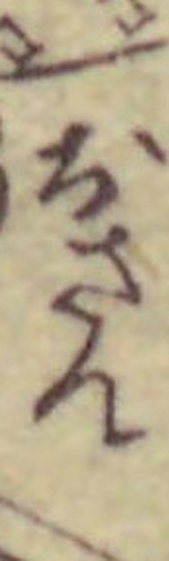おさん
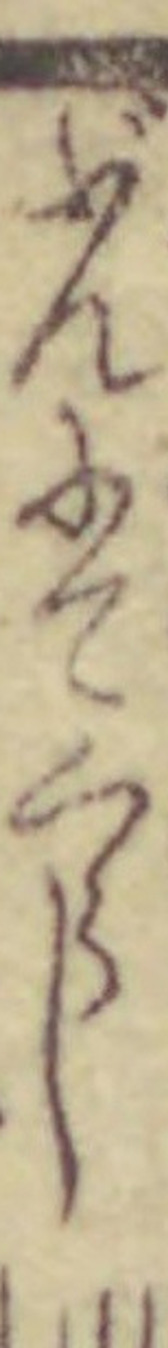ぶんにてくらし
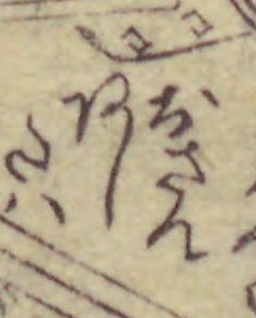おさん
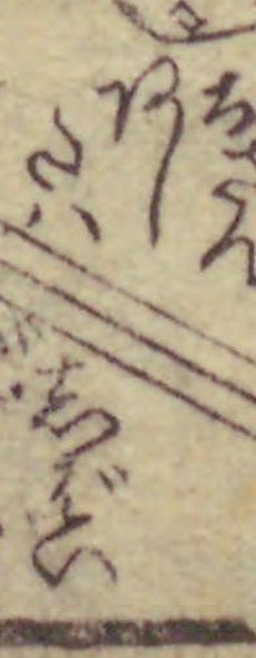しやい
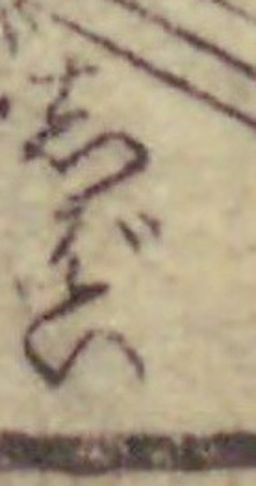しやい
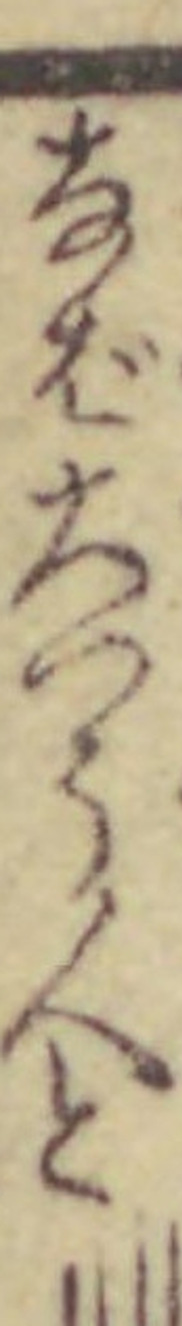なば大つう人と
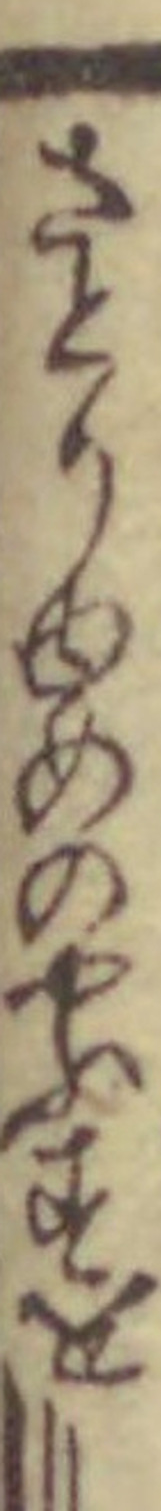さとりゆめのやふすを
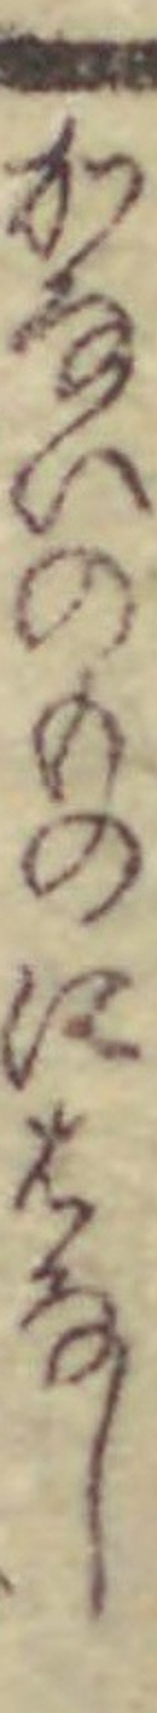かないのものにはなし
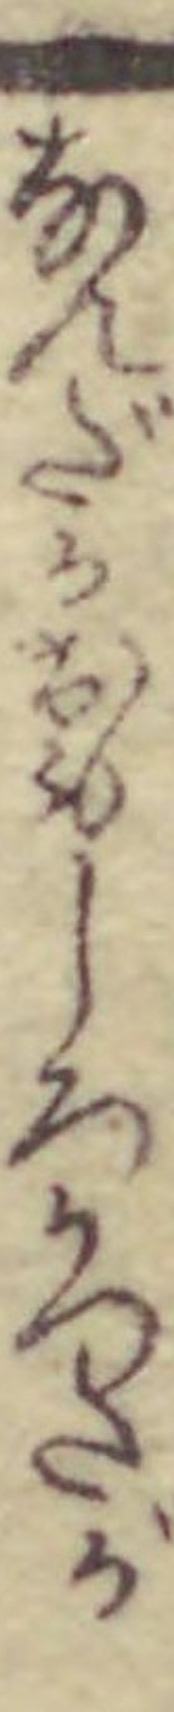なんだかおもしろかつたが
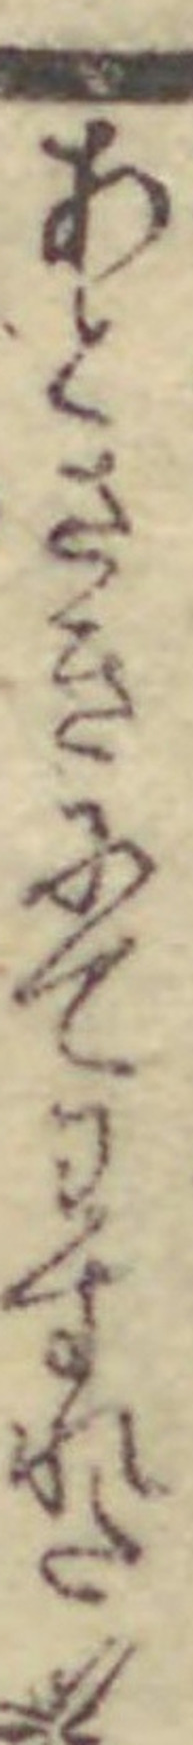あとさきにてわすれた
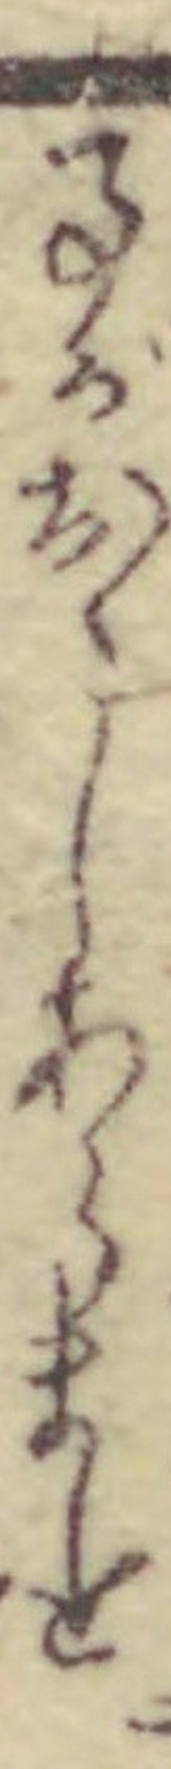事がおゝしあらましを
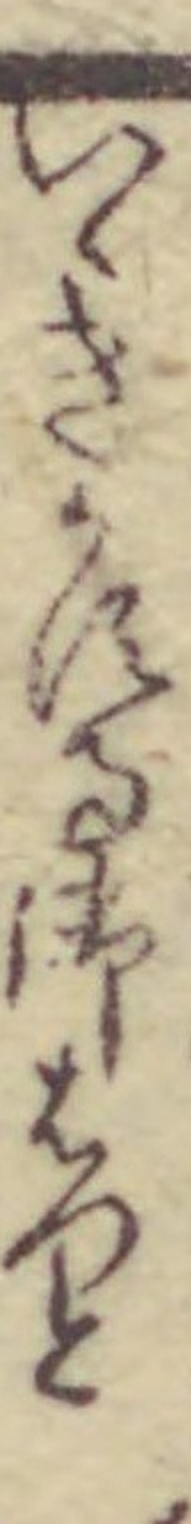いゝきかする御はつと
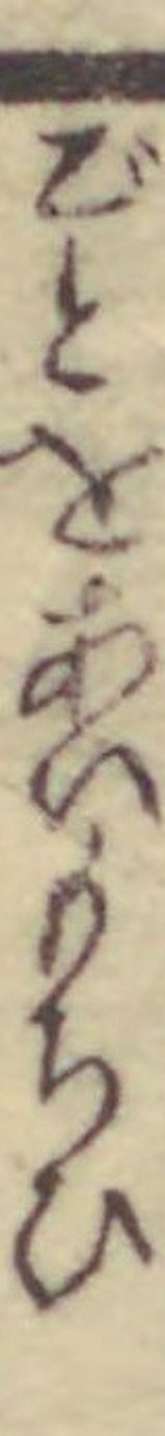ごとをあいもちひ
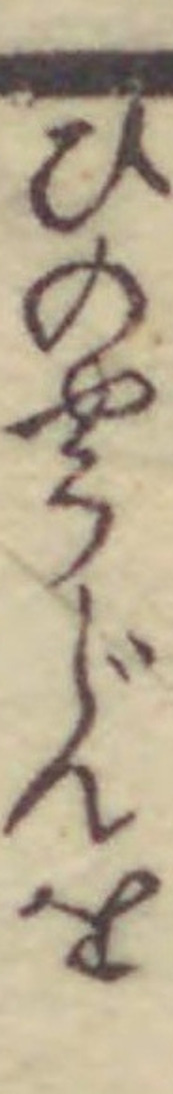ひのやうじんを
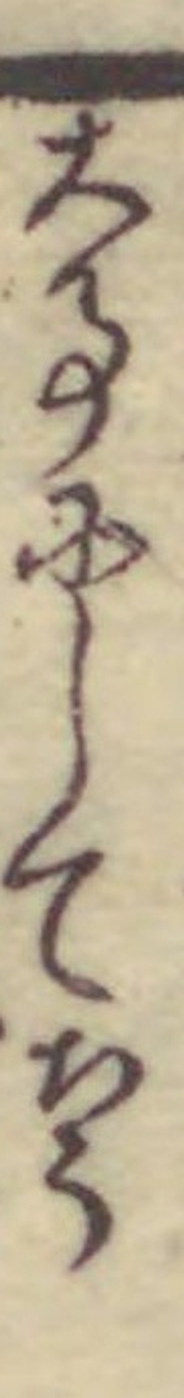大事にしてちう
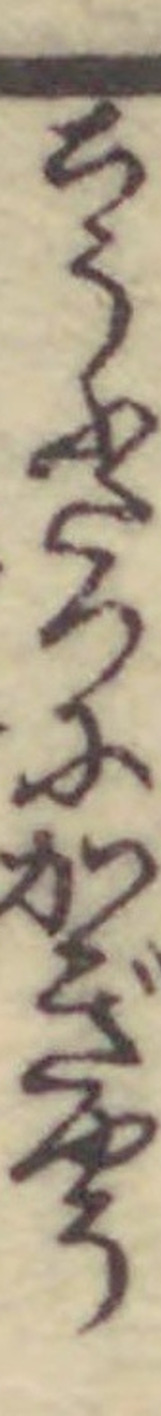こうふたつにかぎやう
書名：大通人穴[サガシ] 3巻
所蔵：国立国会図書館 National Diet Library, JAPAN
